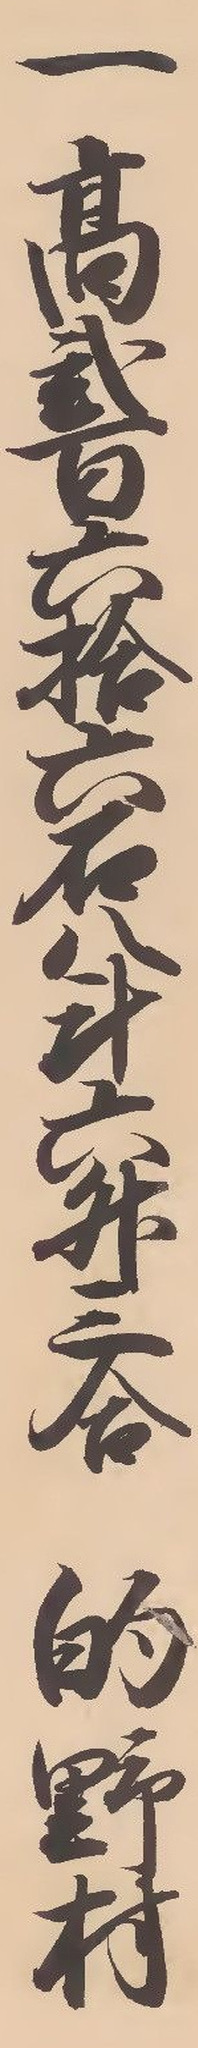一高弐百六拾六石八斗六升三合的野村
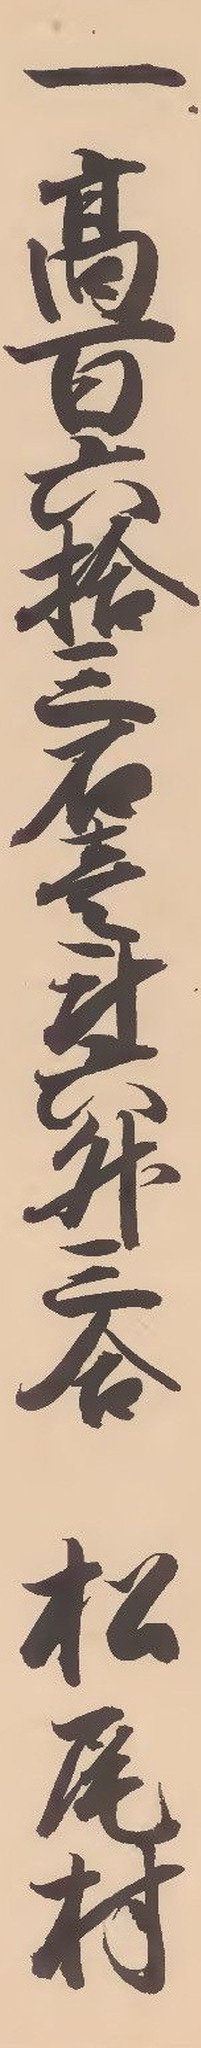一高百六拾三石壱斗六升三合松尾村
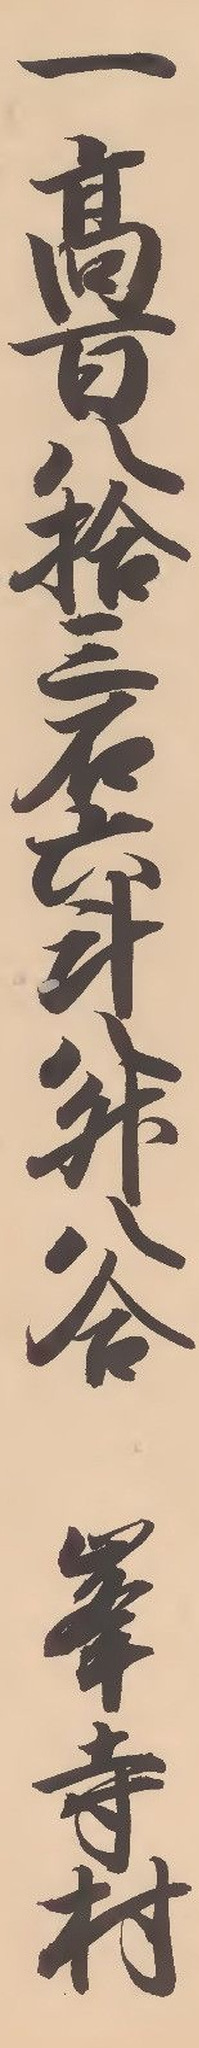一高百八拾三石六斗八升八合峰寺村
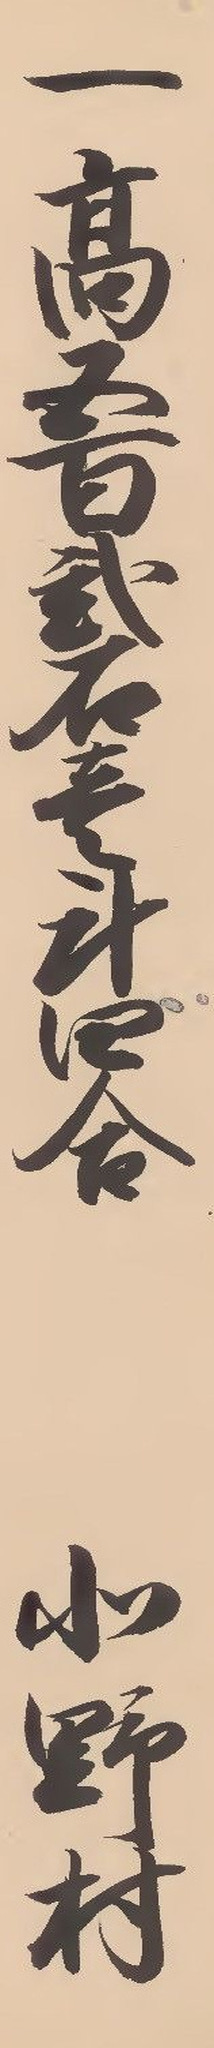一高五百弐石壱斗四合北野村
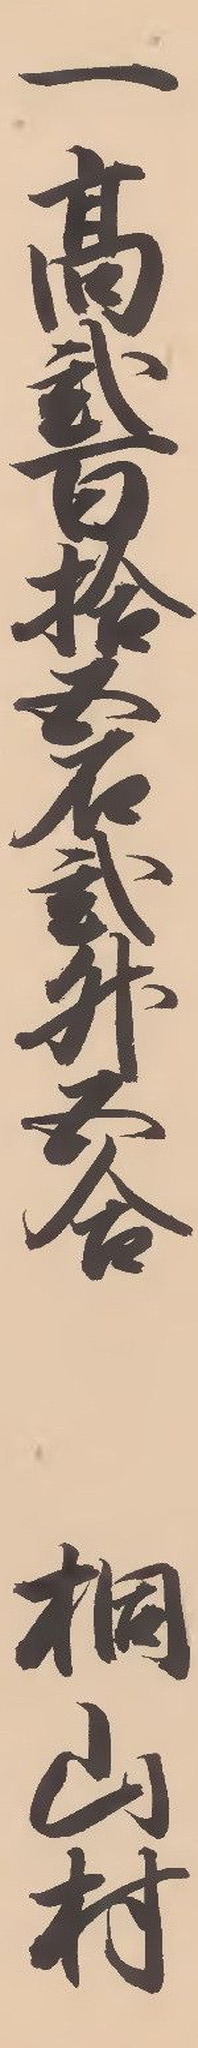一高弐百拾五石弐升五合桐山村
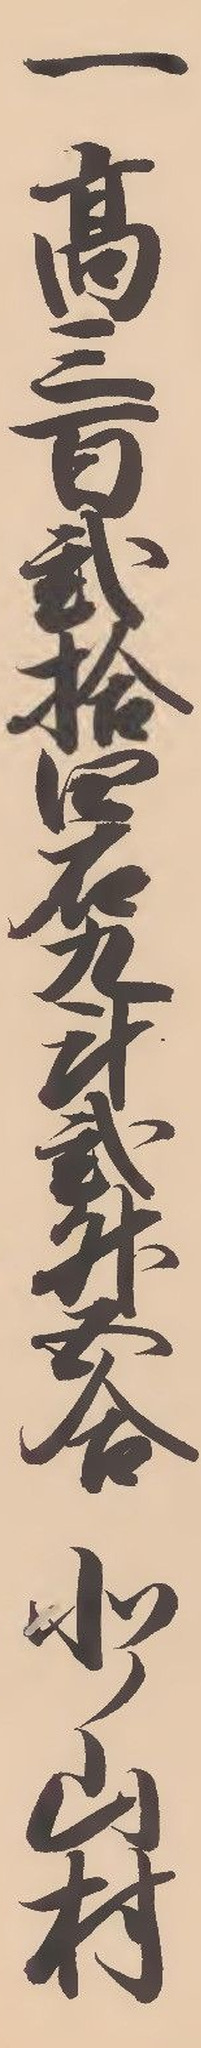一高三百弐拾四石九斗弐升五合北ノ山村
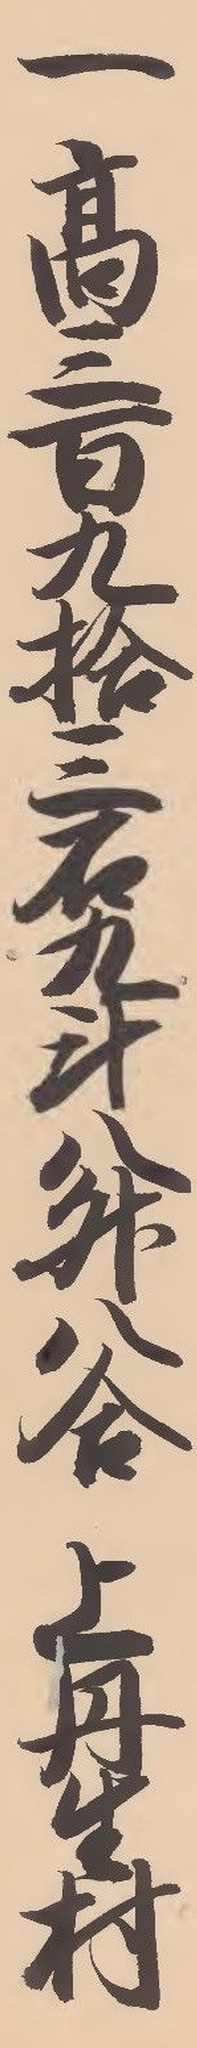一高三百九拾三石九斗八升八合上丹生村

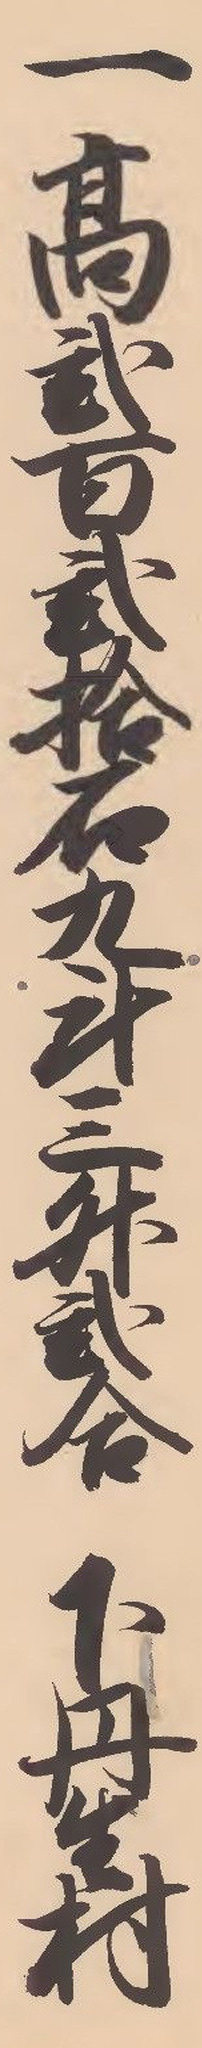一高弐百弐拾石九斗三升弐合下丹生村
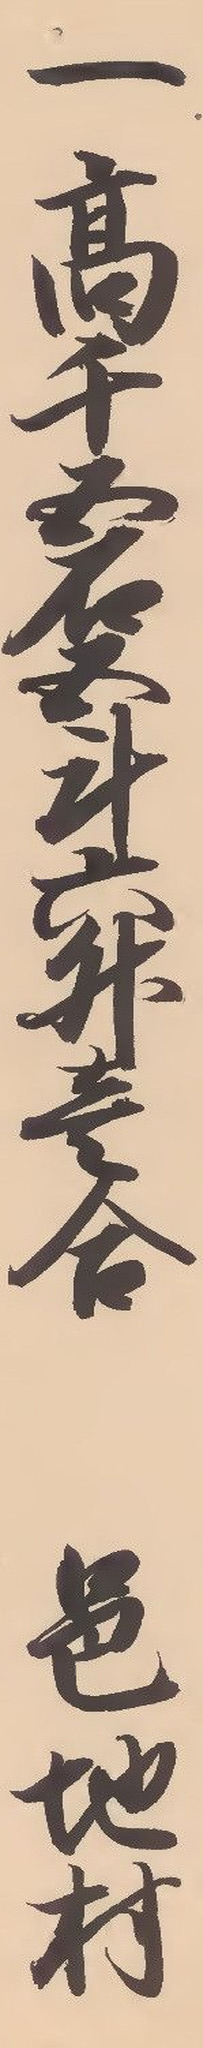一高千五石五斗六升壱合邑地村
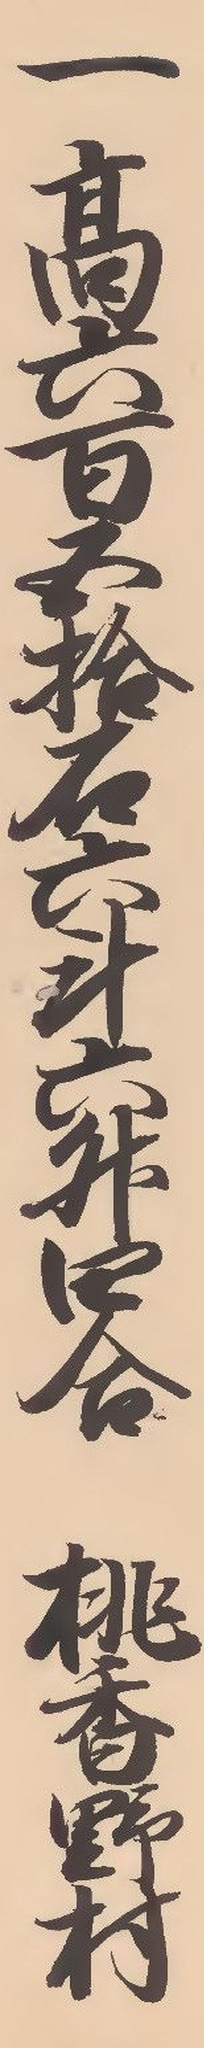一高六百五拾石六斗六升四合桃香野村
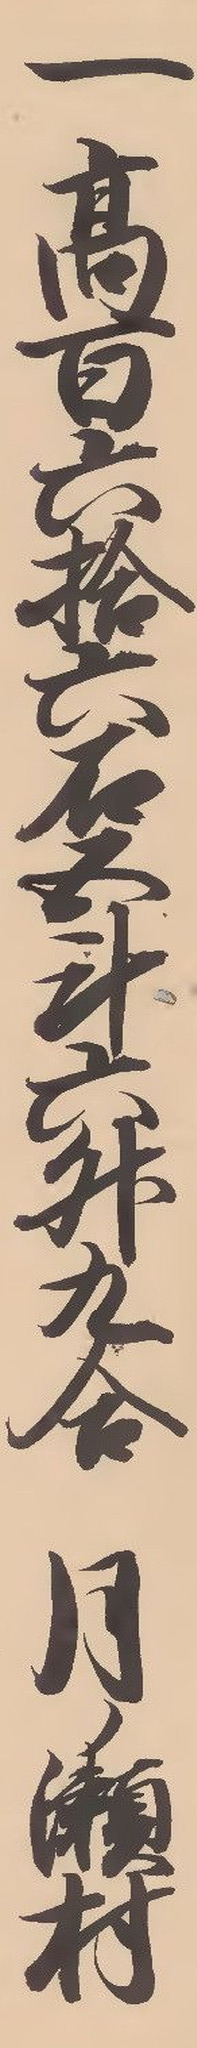一高百六拾六石五斗六升九合月ノ瀬村
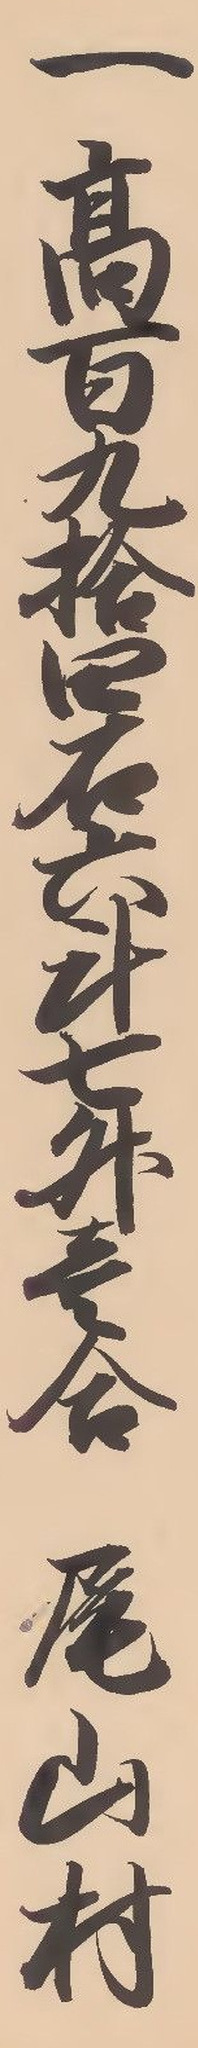一高百九拾四石六斗七升壱合尾山村
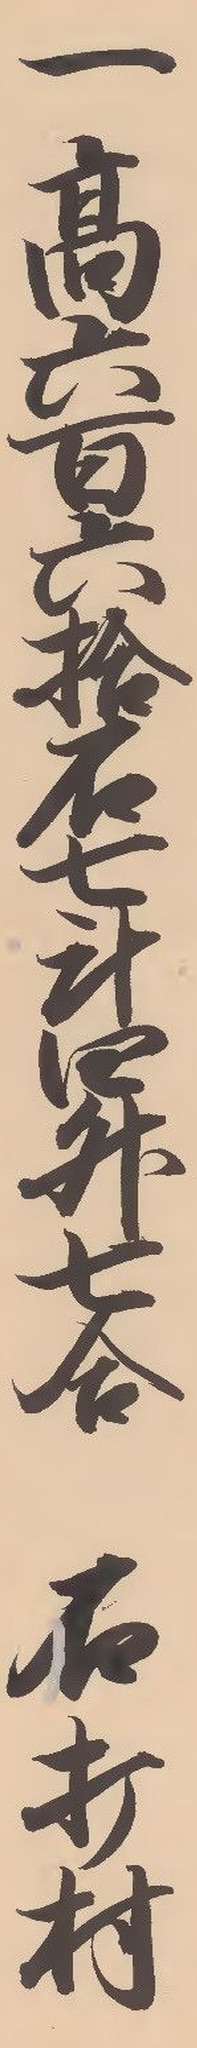一高六百六拾石七斗四升七合石打村

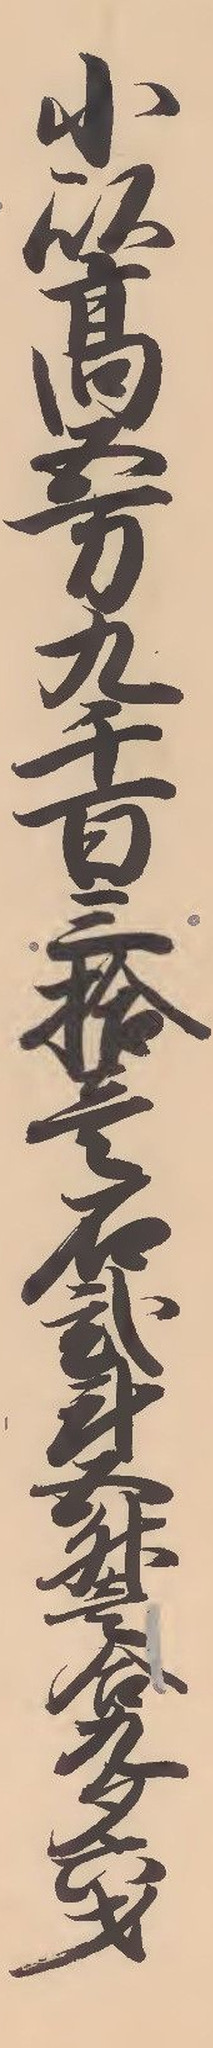小以高五万九千百三拾壱石弐斗五升壱合九勺六才
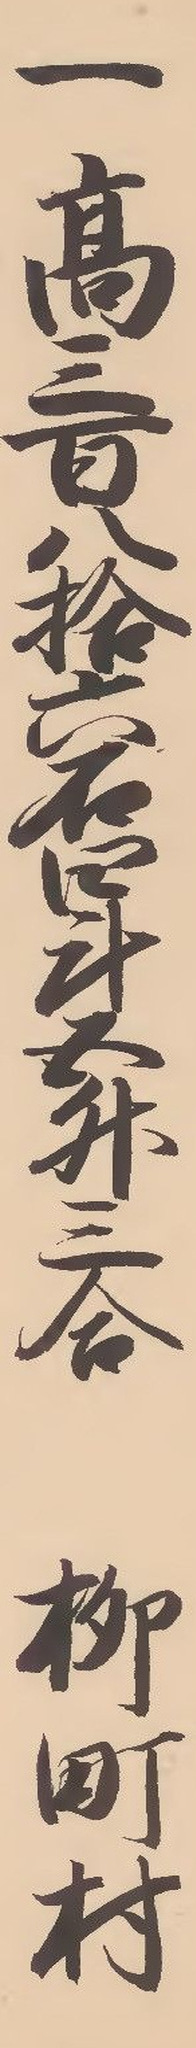一高三百八拾六石四斗五升三合柳町村
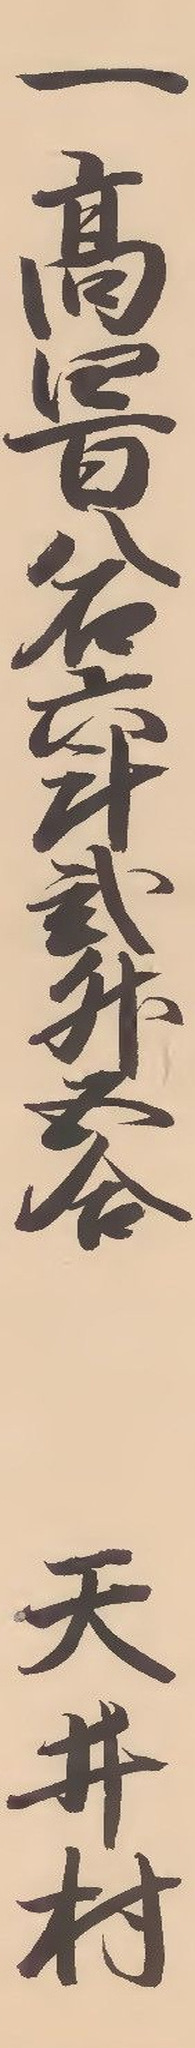一高四百八石六斗弐升五合天井村
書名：大和国郷帳
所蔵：国立公文書館 National Archives of Japan
